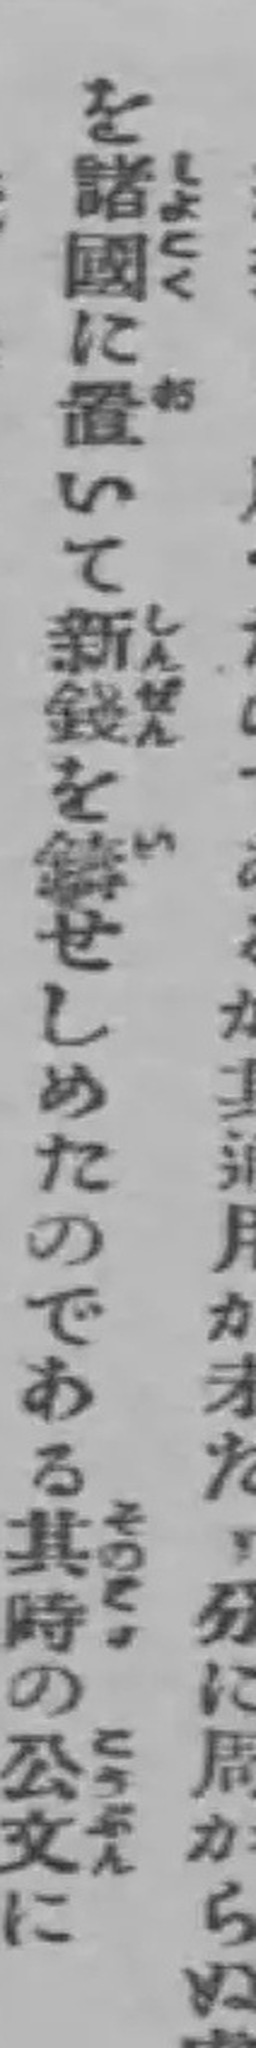を諸国に置いて新銭を鋳せしめたのである其時の公文に
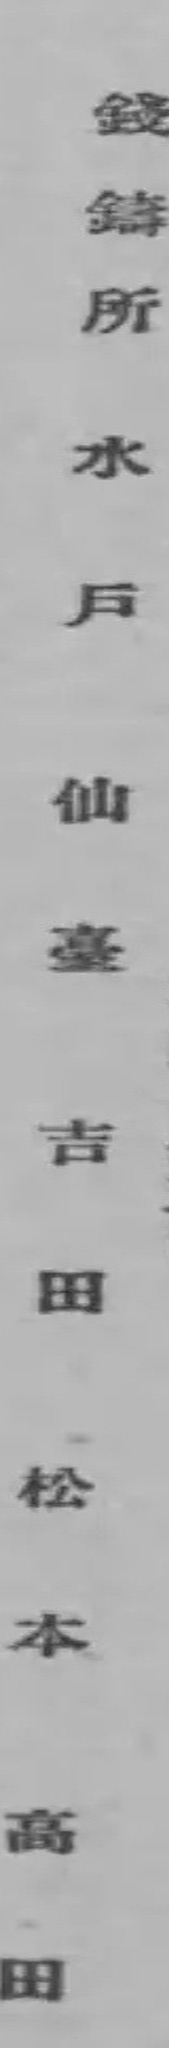銭鋳所水戸仙台吉田松本高田
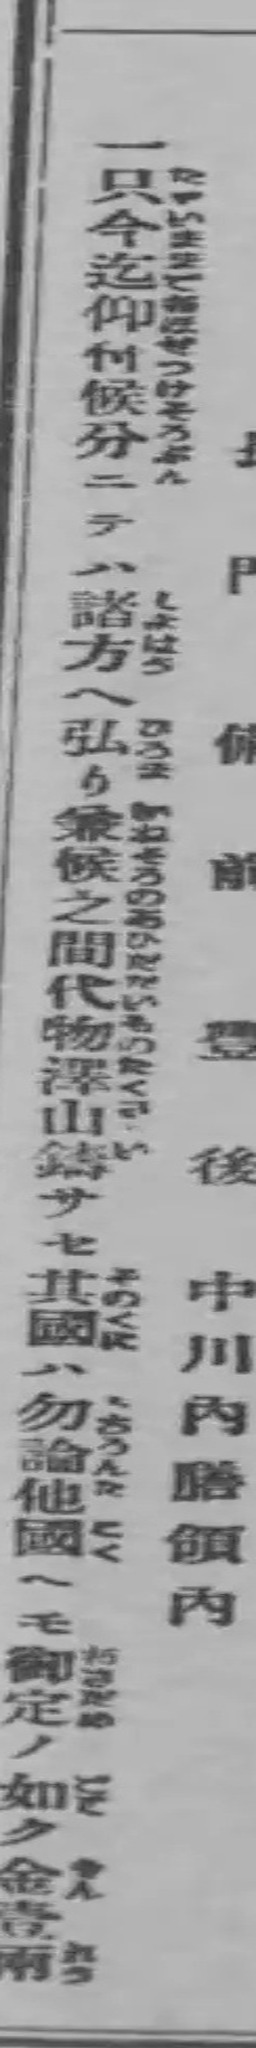一只今迄仰付候分ニテハ諸方へ弘り兼候之間代物沢山鋳サセ其国ハ勿論他国ヘモ御定ノ如ク金壱両
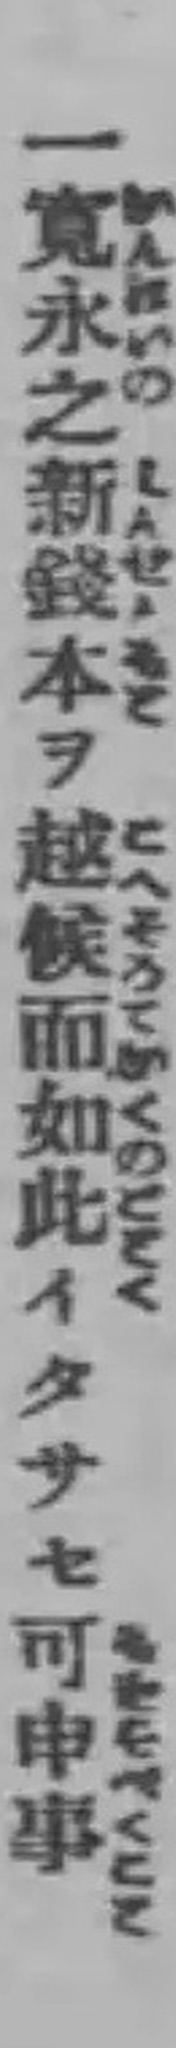一寛永之新銭本ヲ越候而如此イタサセ可申事
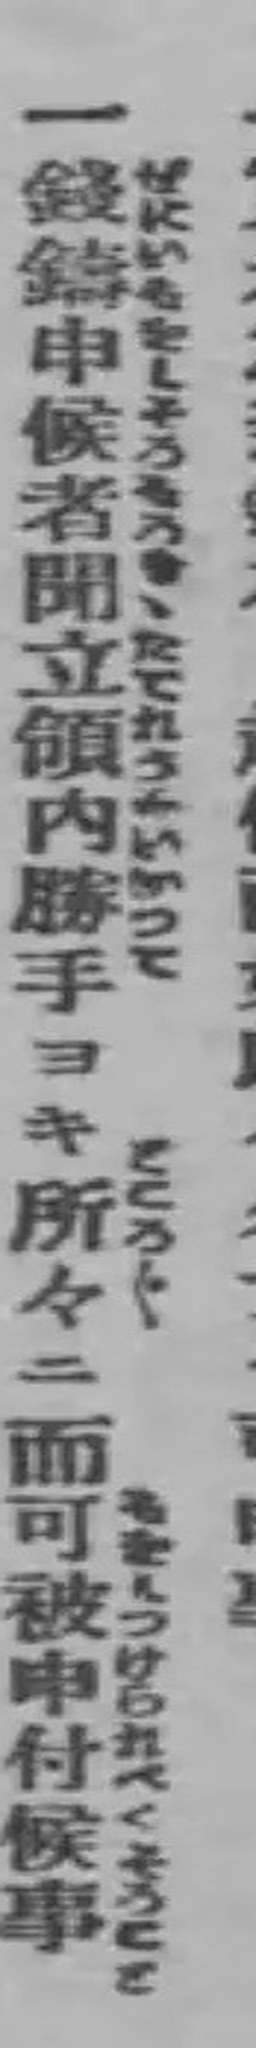一銭鋳申候者聞立領内勝手ヨキ所々ニ而可被申付候事
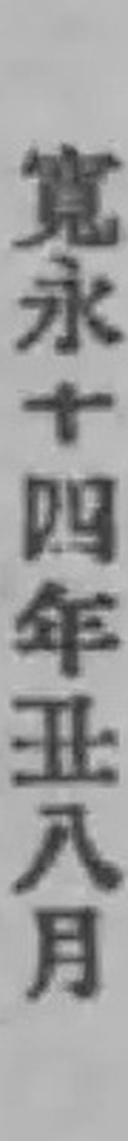寛永十四年丑八月
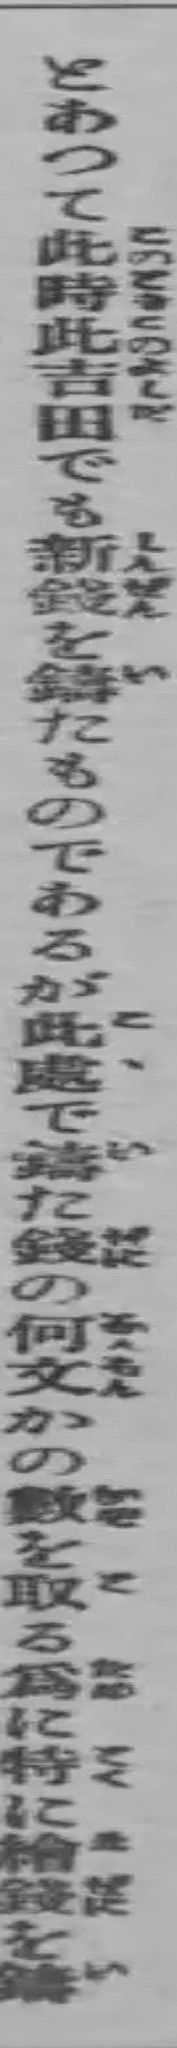とあつて此時此吉田でも新銭を鋳たものであるが此処で鋳た銭の何文かの数を取る為に特に絵銭を鋳
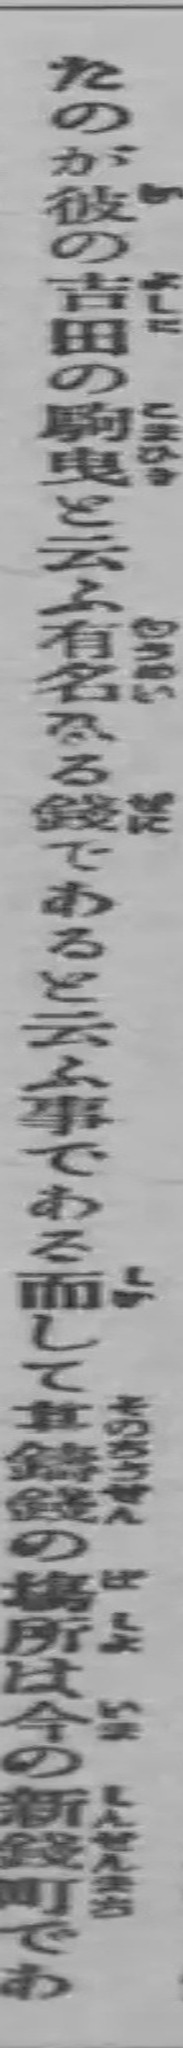吉田の駒曳たのが彼の吉田の駒曳と云ふ有名なる銭であると云ふ事である而して其鋳銭の場所は今の新銭町であ
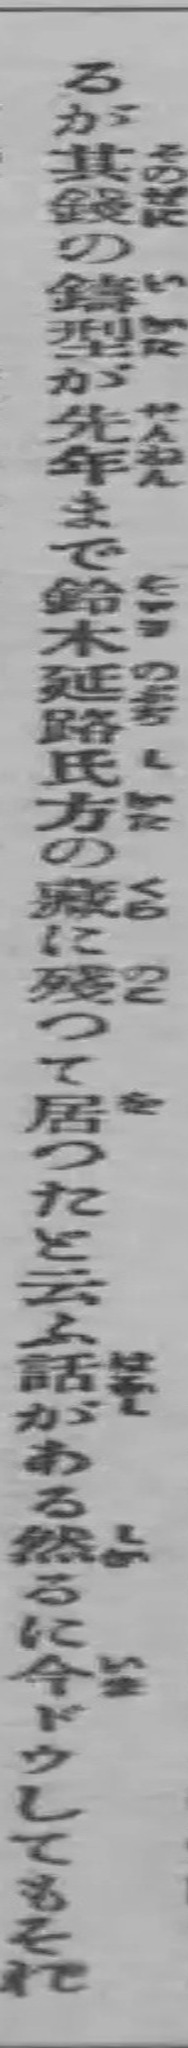新銭町るが其銭の鋳型が先年まで鈴木延路氏方の蔵に残つて居つたと云ふ話がある然るに今ドウしてもそれ
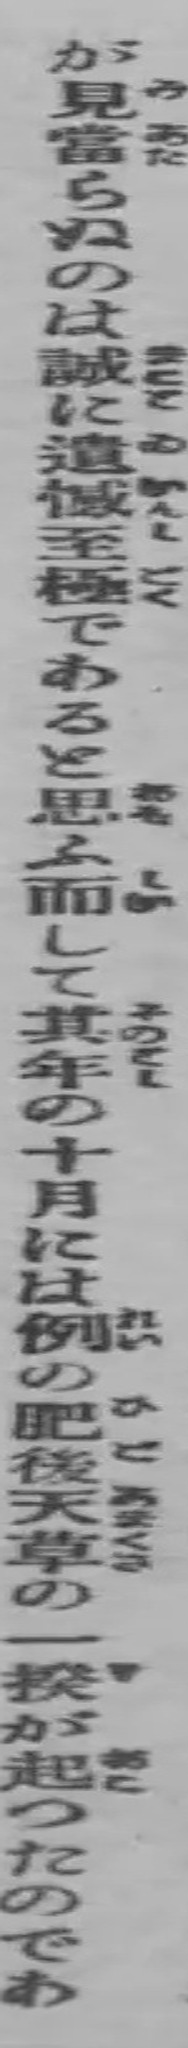が見当らぬのは誠に遺憾至極であると思ふ而して其年の十月には例の肥後天草の一揆が起つたのであ
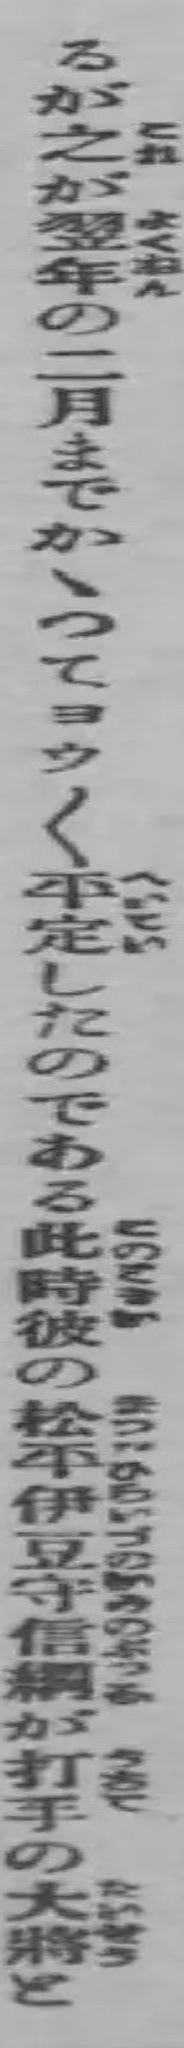るが之が翌年の二月までかゝつてヨウ〳〵平定したのである此時彼の松平伊豆守信綱が打手の大将と
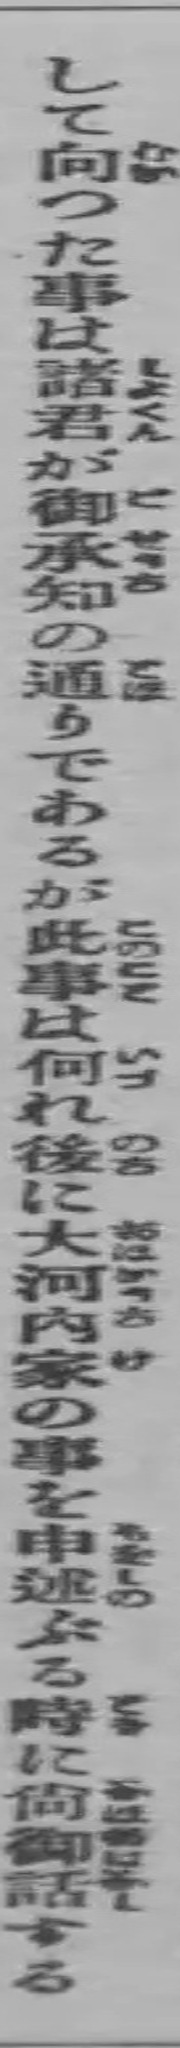して向つた事は諸君が御承知の通りであるが此事は何れの後に大河内家の事を申述ぶる時に尚御話する
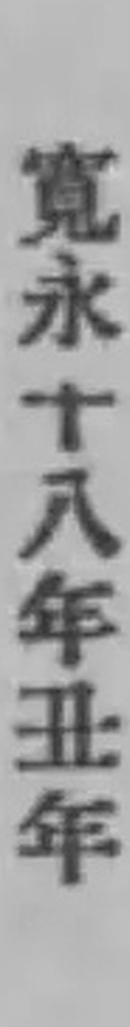寛永十八年丑年
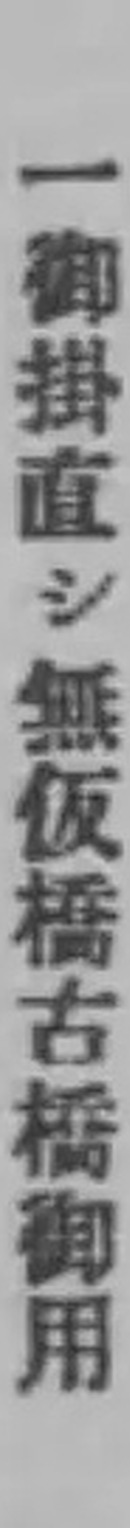一御掛直シ無仮橋古橋御用
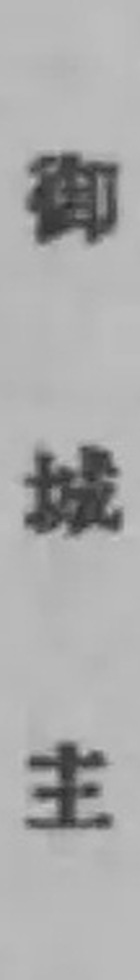御城主
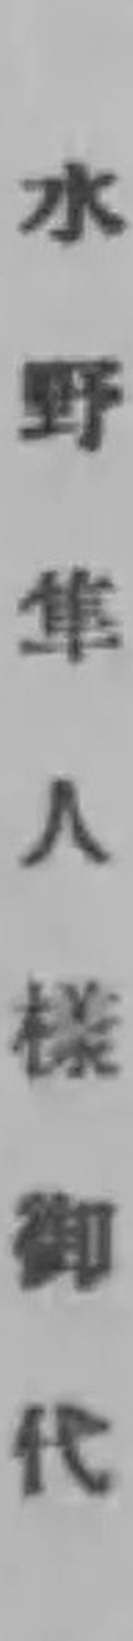水野隼人正様御代
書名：豊橋市史談
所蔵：国立国会図書館 National Diet Library, JAPAN
